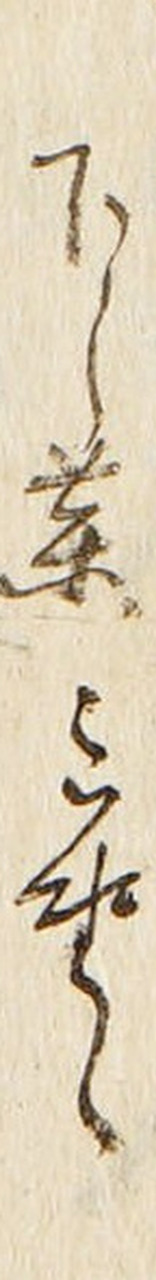下し薬に御坐候
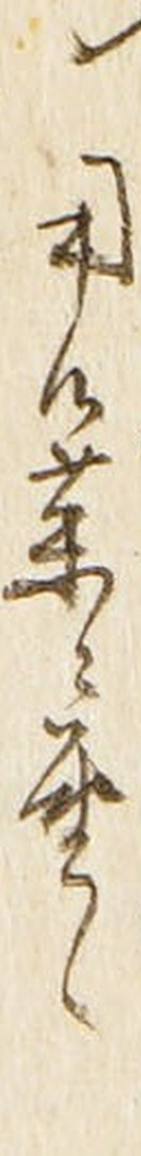用候薬に御坐候
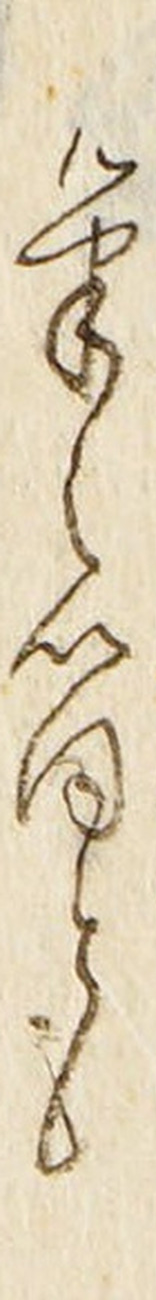筆之筒とも
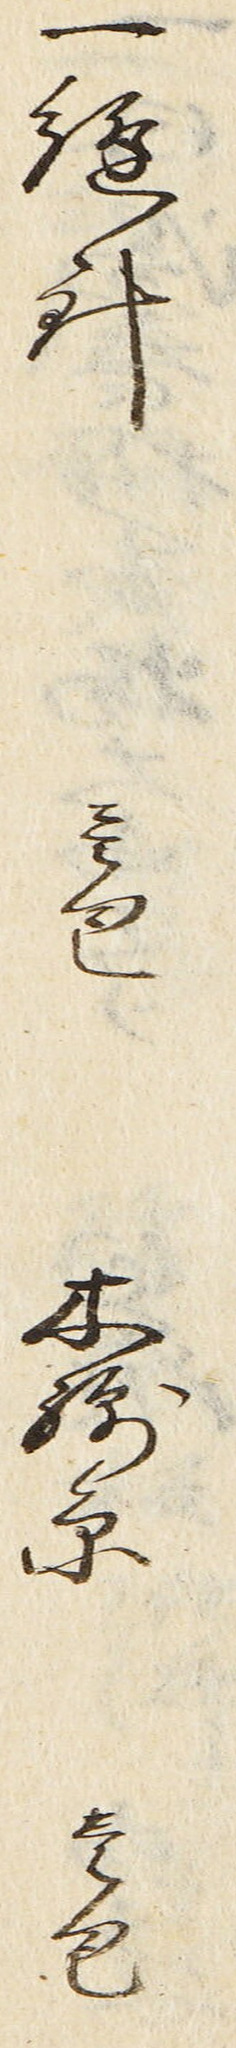一縫針壱包木綿糸壱包
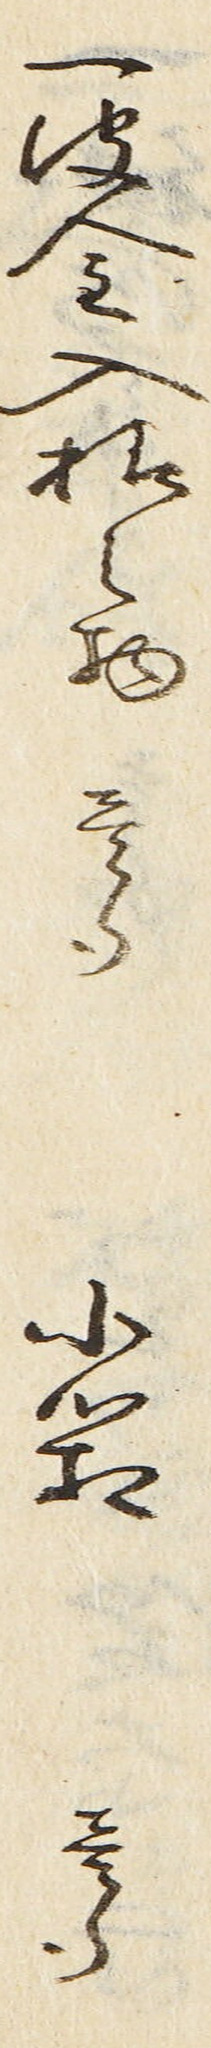一皮金入様之物壱つ小箱壱ツ
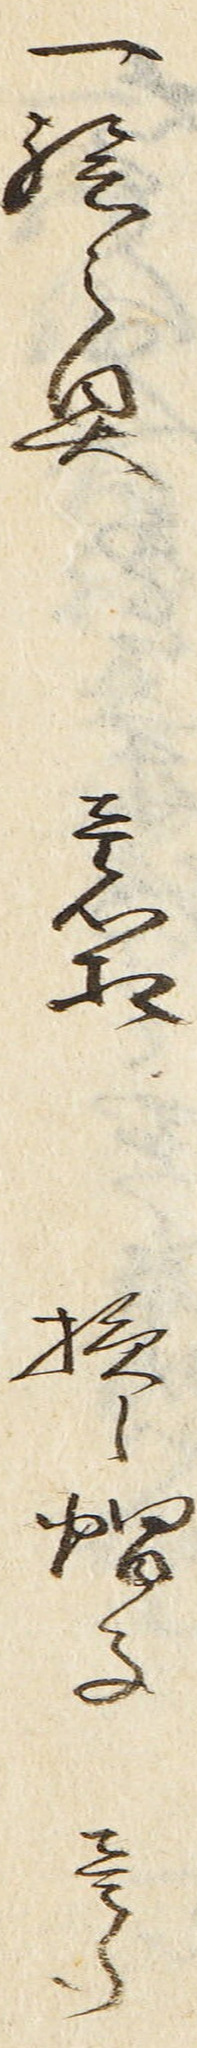一絵之具壱箱損之帽子壱ツ
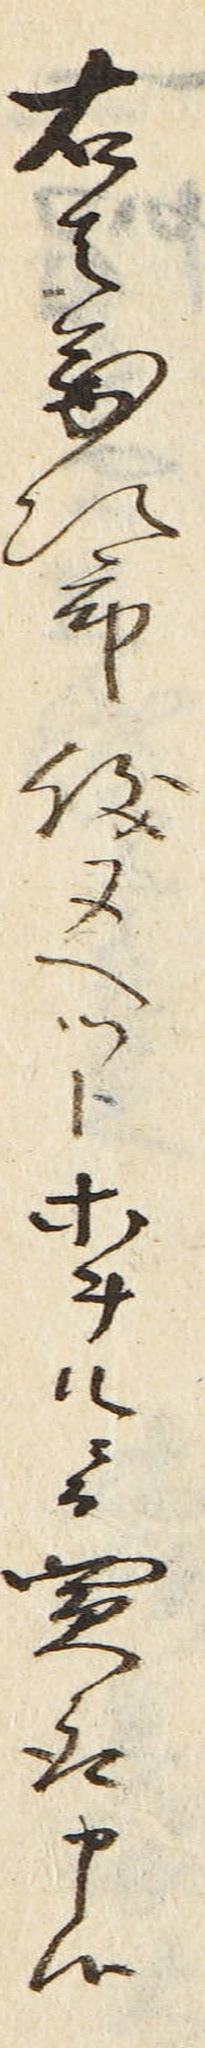右は万次郎儀ヌヘツトホヲルに而買取申候

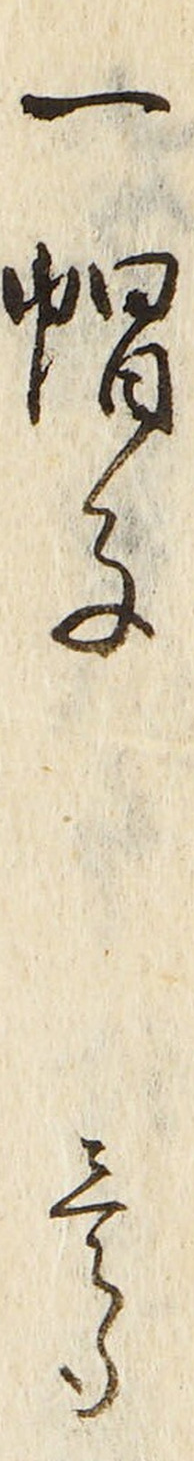一帽子壱ツ
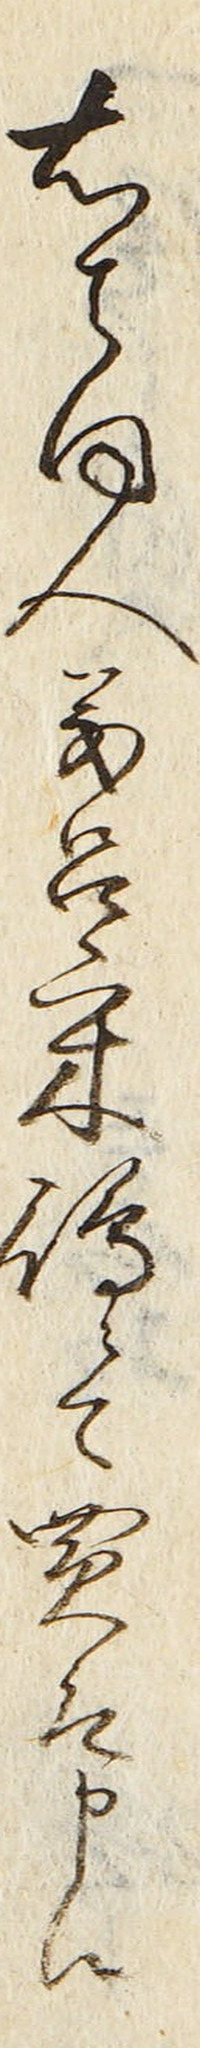右は同人義呂宋嶋にて買取申候
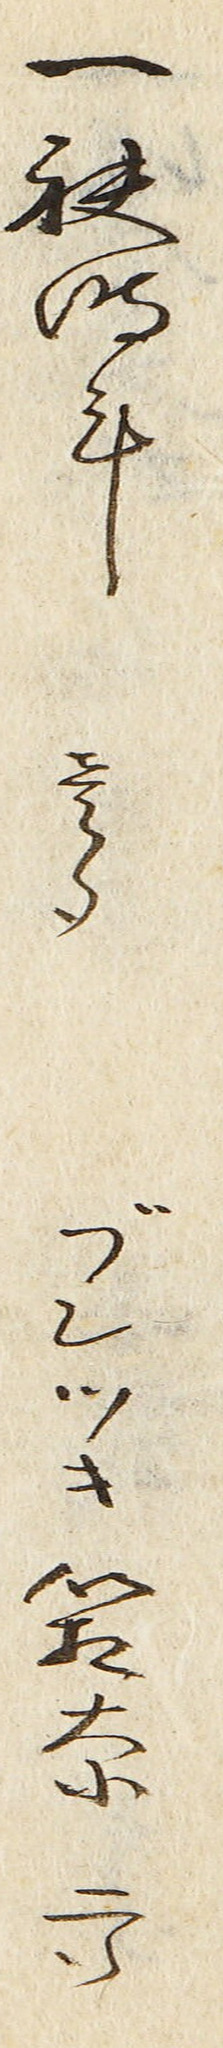一袂都計壱ツブレツキ箱大小二ツ
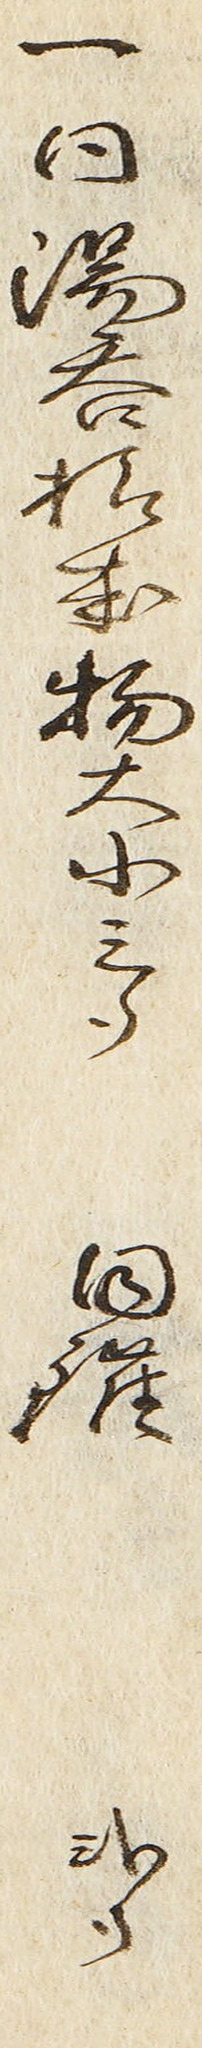一同湯呑様成物大小三ツ同鑼弐ツ
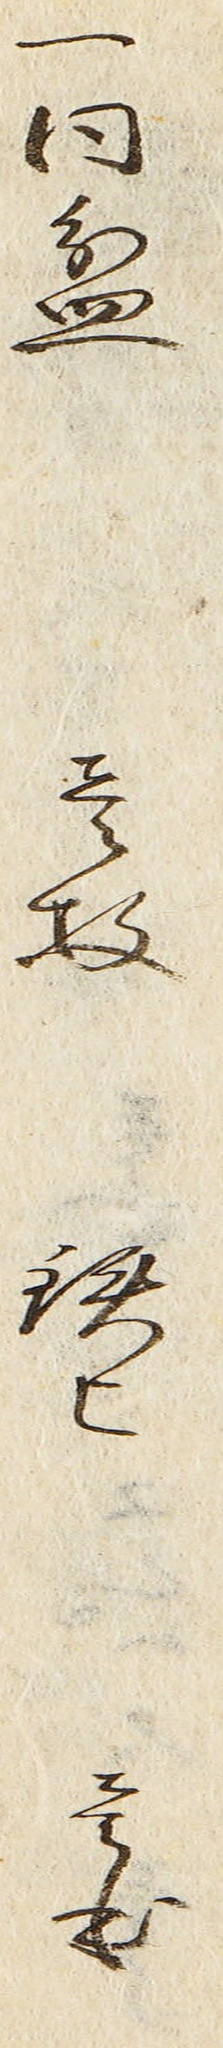一同盆壱枚鉄匕壱本
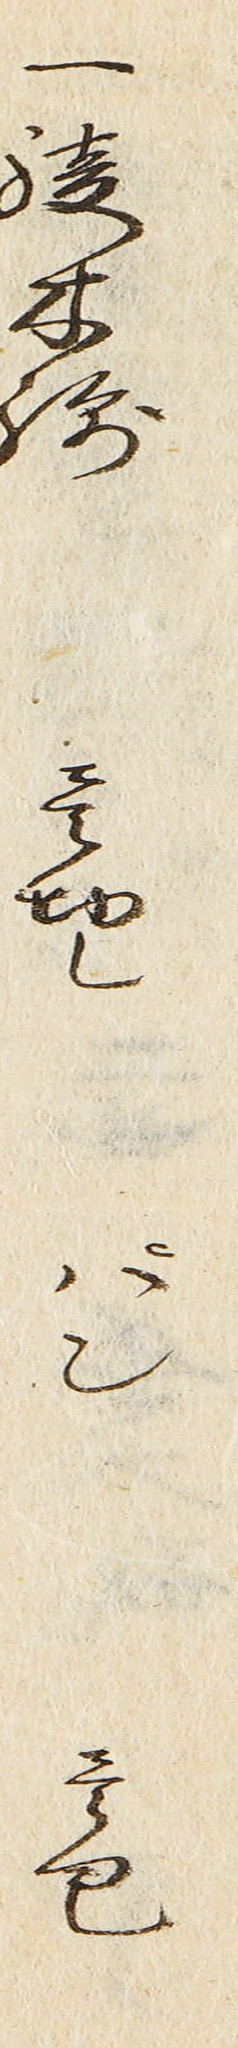一綾木綿壱切れパン壱包
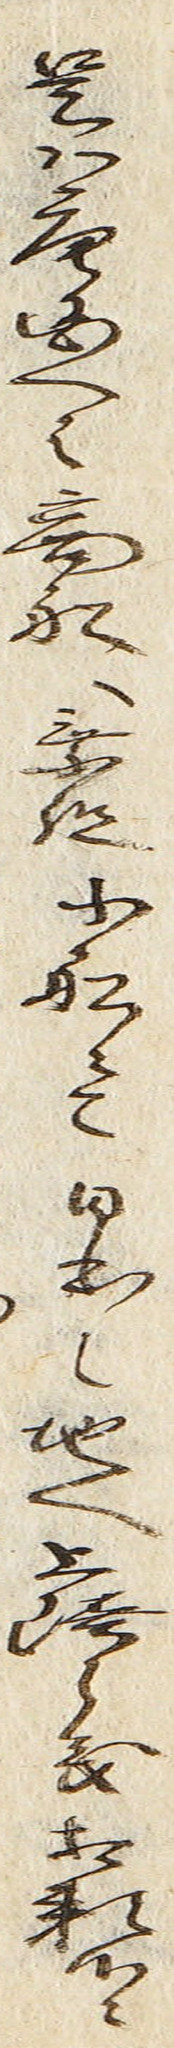是は唐国へ之商船へ乗組小船にて日本之地へ上陸之義相頼候に
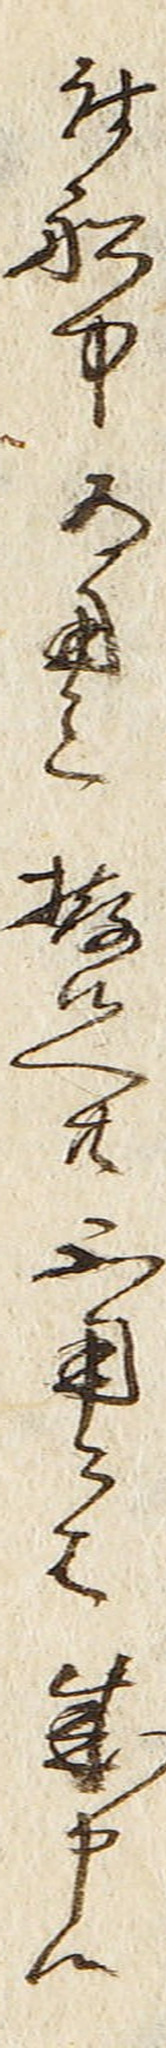付船中為用之拵候へ共不用には成申候
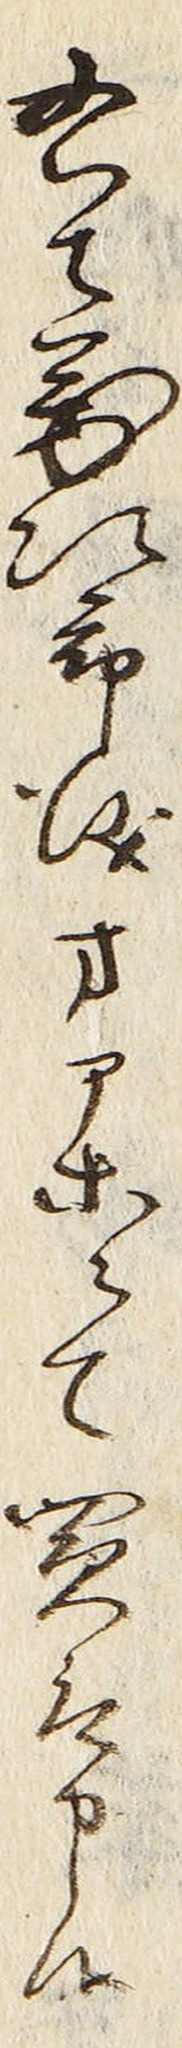右は万次郎儀オアホにて買取申候
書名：土佐中浜万次郎漂流記
